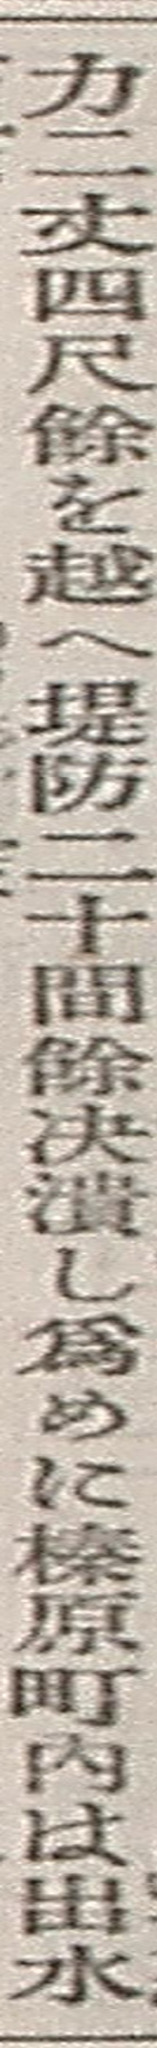力二丈四尺餘を越へ堤防二十間餘决潰し為めに榛原町内は出水
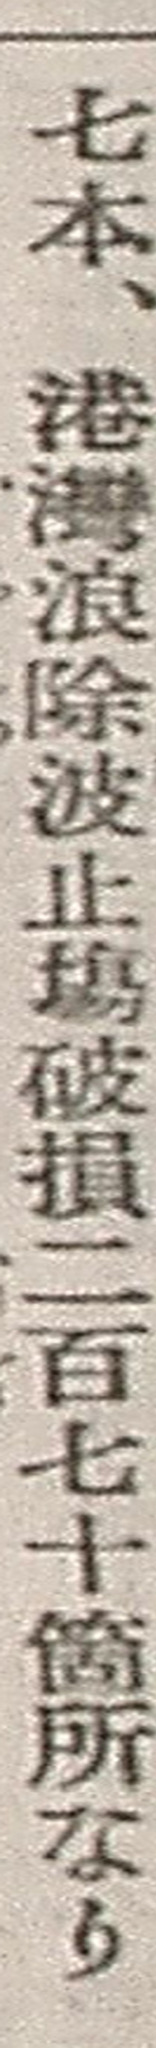七本、港湾浪除波止場破損二百七十箇所なり
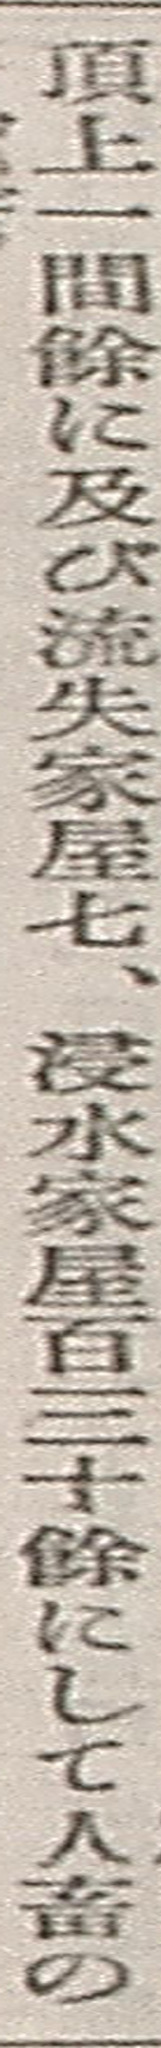頂上一間餘に及び流失家屋七、浸水家屋百三十餘にして人畜の
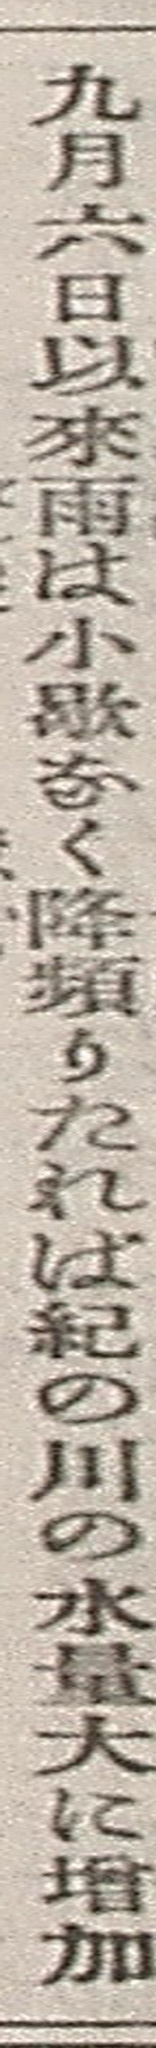九月六日以来雨は小歇なく降頻りたれば紀の川の水量大に増加
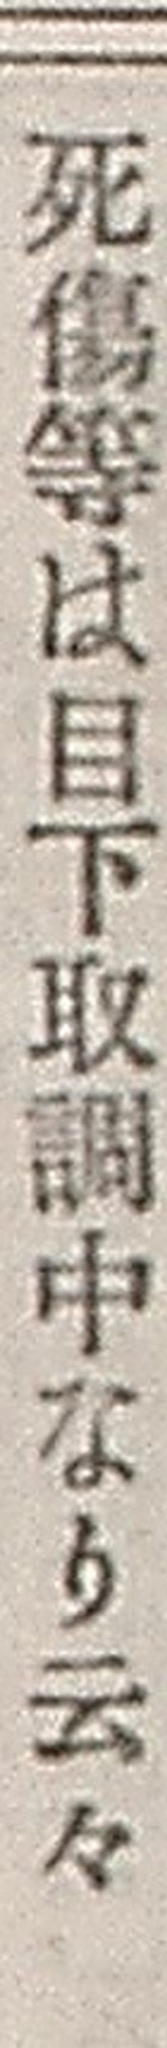死傷等は目下取調中なり云々
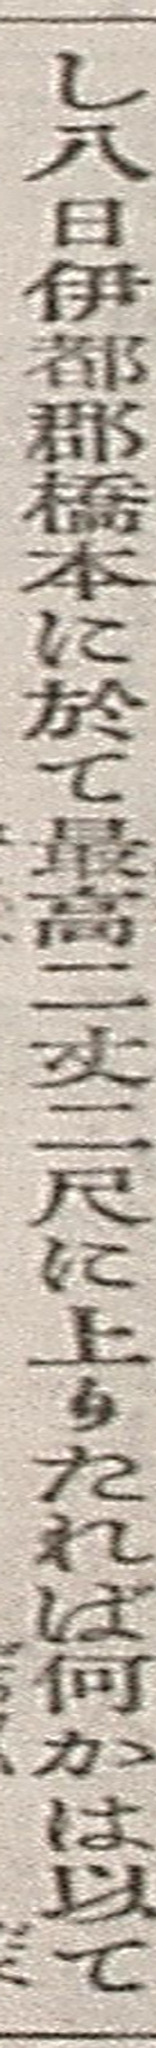し八日伊都郡橋本に於て最高二丈二尺に上りたれば何かは以て
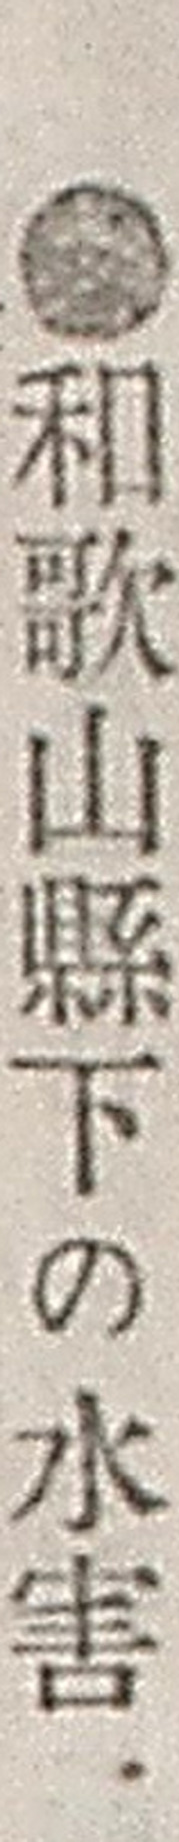●和歌山県下の水害
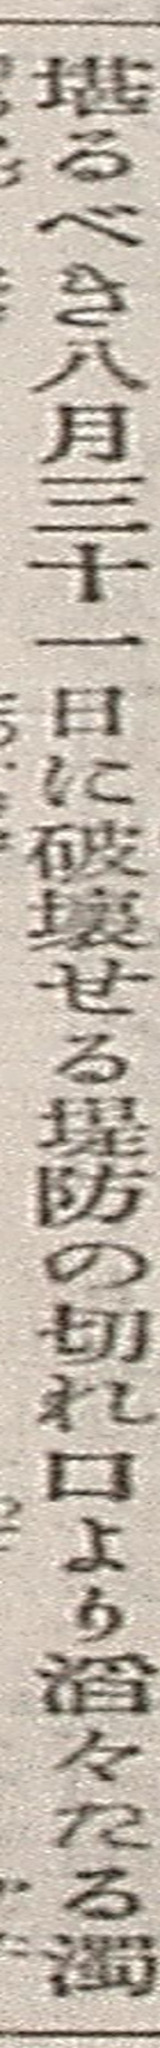堪るべき八月三十一日に破壊せる堤防の切れ口より滔々たる濁
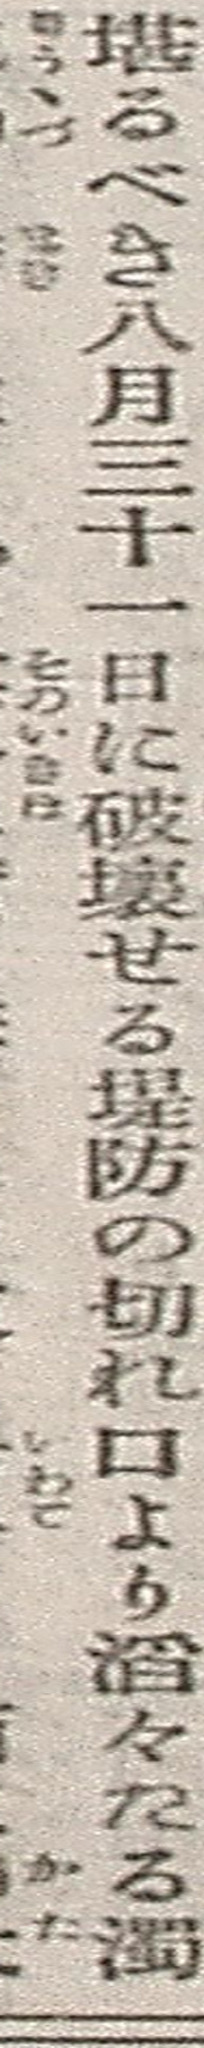堪るべき八月三十一日に破壊せる堤防の切れ口より滔々たる濁
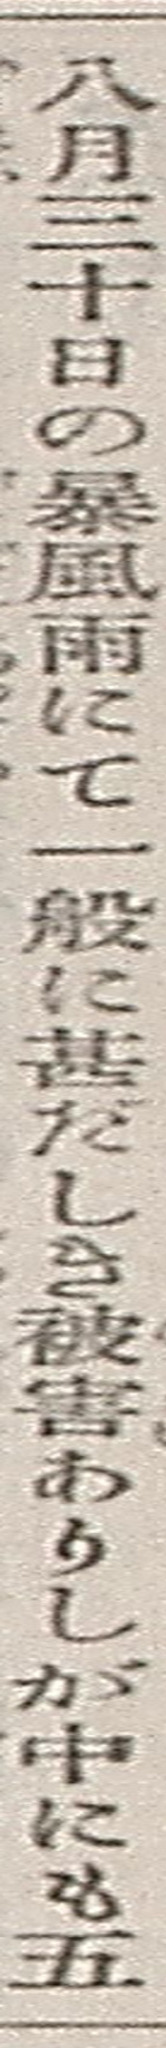八月三十日の暴雨風にて一般に甚だしき被害ありしが中にも五
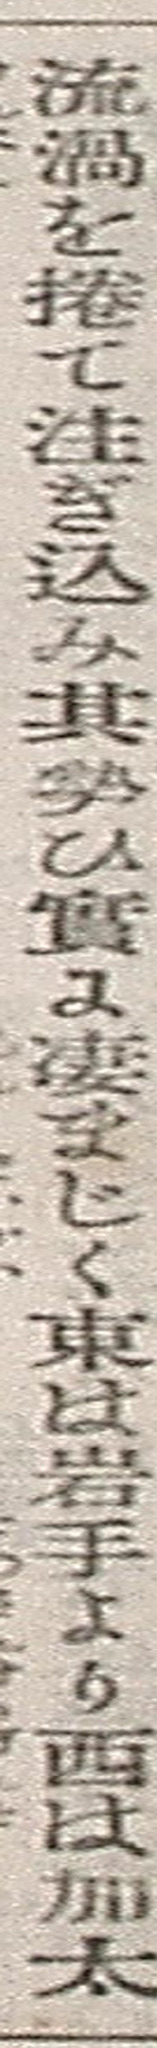流渦を捲て注ぎ込み其勢ひ実に凄まじく東は岩手より西は加太
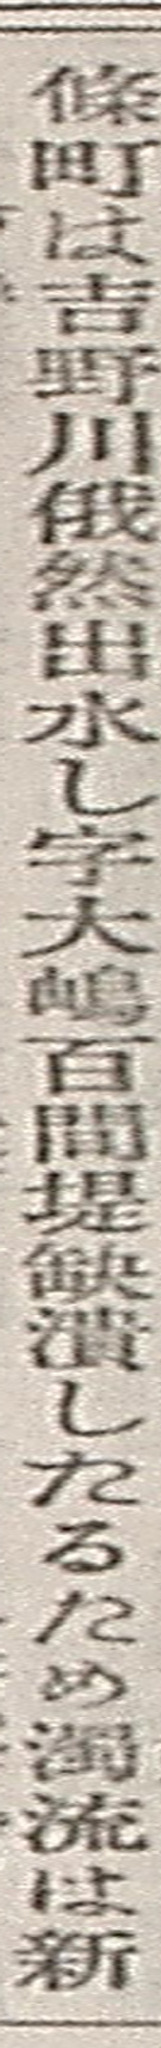條町は吉野川俄然出水し字大嶋百間堤缺潰したるため濁流は新
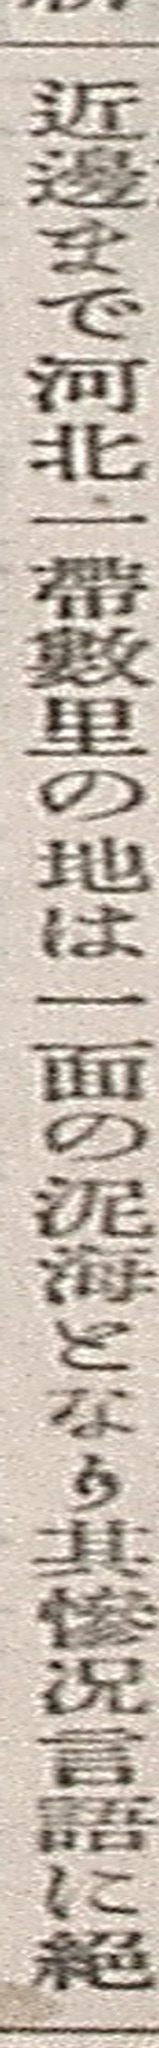近辺まで河北一帯数里の地は一面の泥海となり其惨況言語に絶
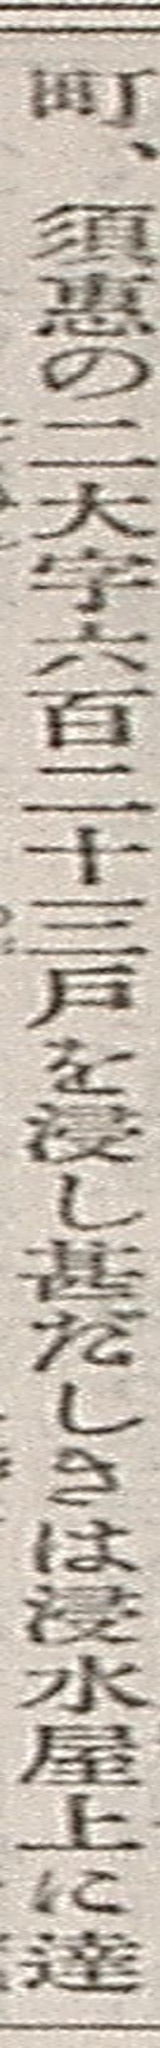町、須恵の二大字六百二十三戸を浸し甚だしきは浸水屋上に達
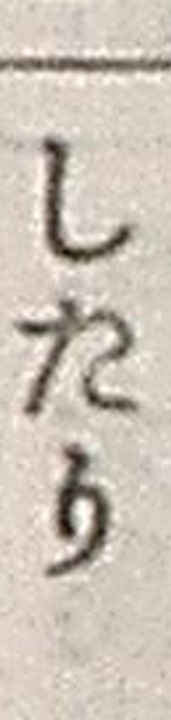したり
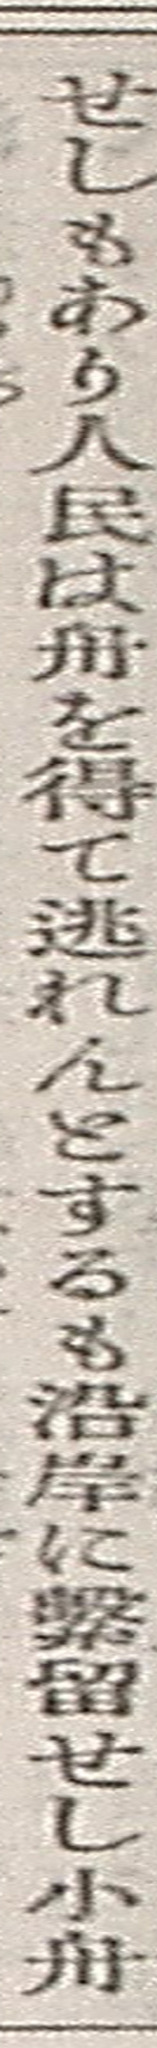せしもあり人民は舟を得て逃れんとするも沿岸に繋留せし小舟
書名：風俗畫報臨時増刊第百二十八號　洪水被害録（下）
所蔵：東京大学地震研究所図書室 Earthquake Research Institute Library, The University of Tokyo, JAPAN
